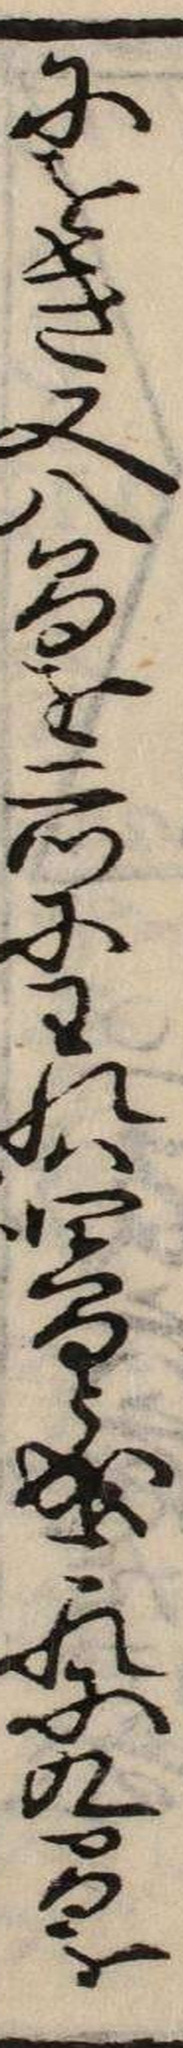にをき又八間を二つにわれは四間と成これに九間を
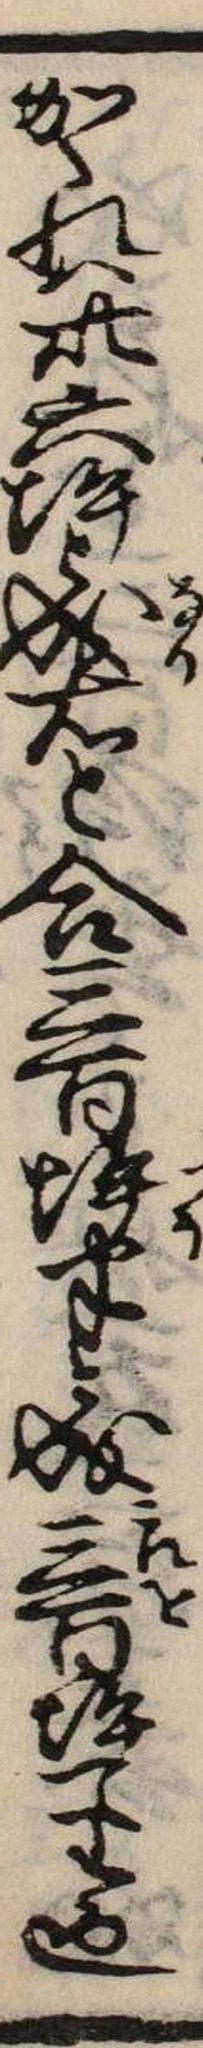かくれは丗六坪と成右と合三百坪半と成三百坪てわる也
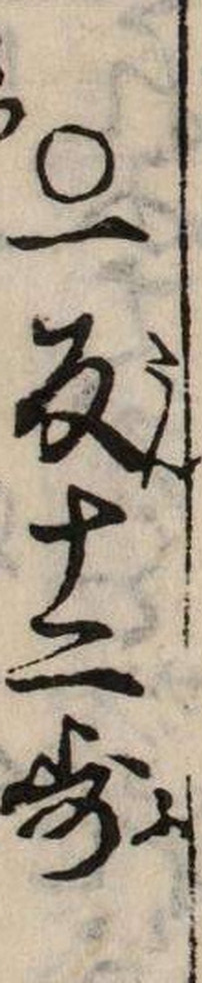○一反十二歩
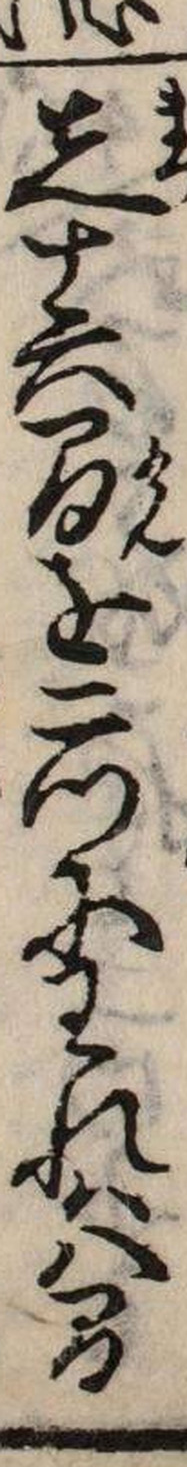先十六間を二つにわれは八間
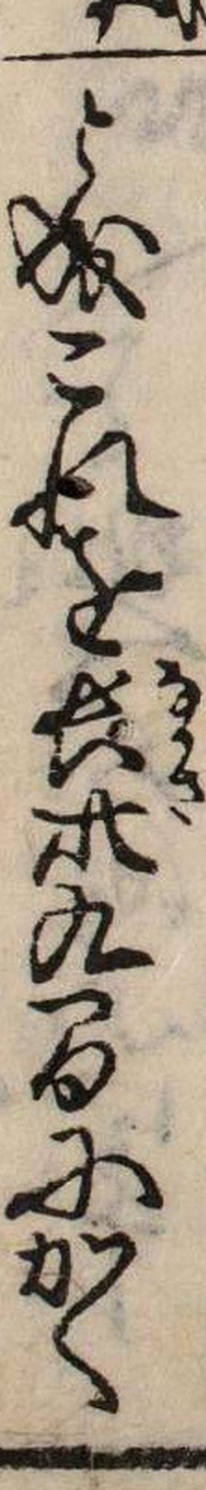と成これを長丗九間にかく
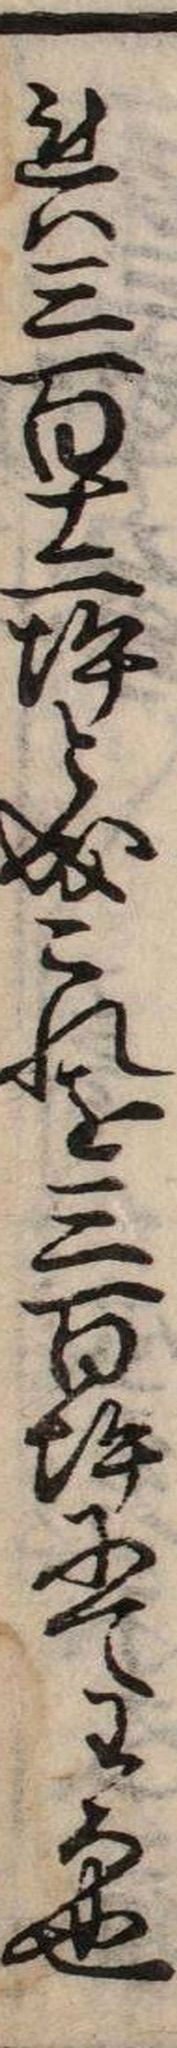れは三百十二坪と成これを三百坪にてわる也

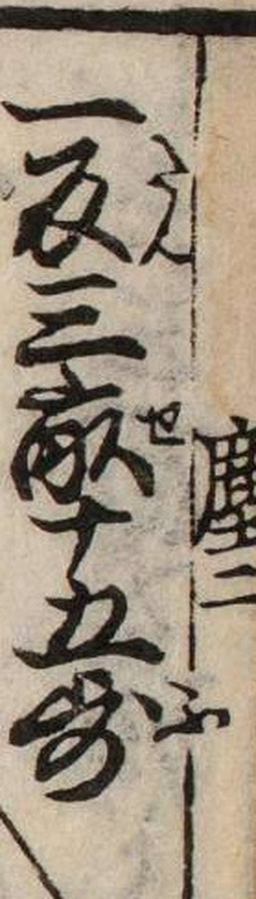一反三畝十五歩
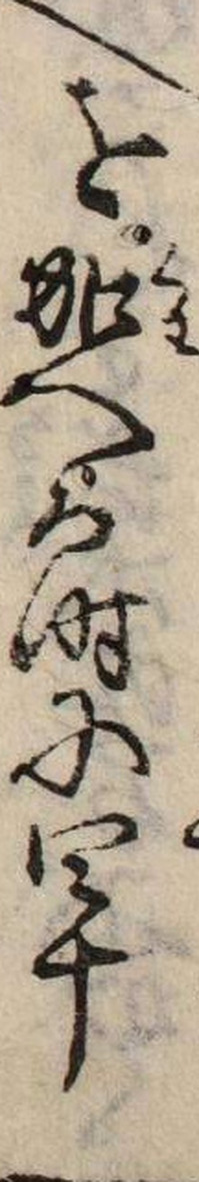を加へる時に四十
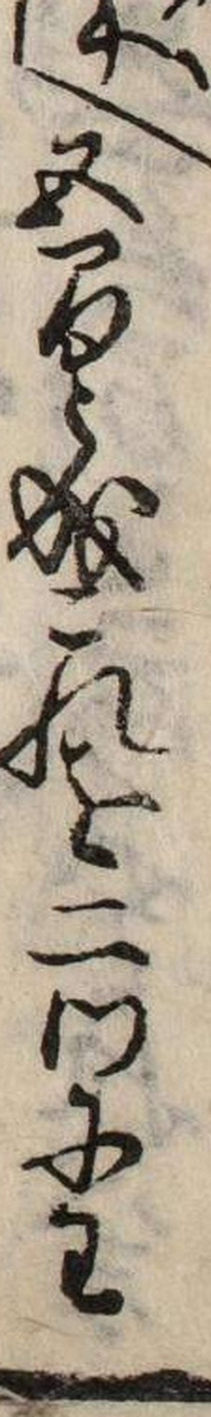五間と成これを二つにわ
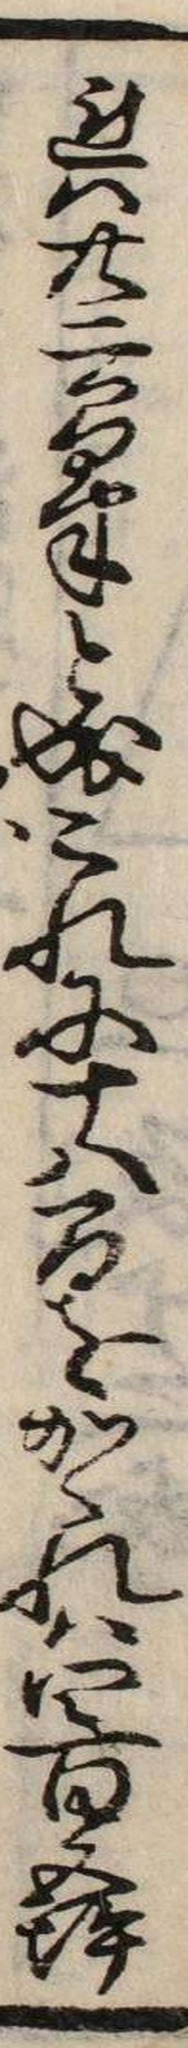れは廿三間半と成これに十八間をかくれは四百五坪
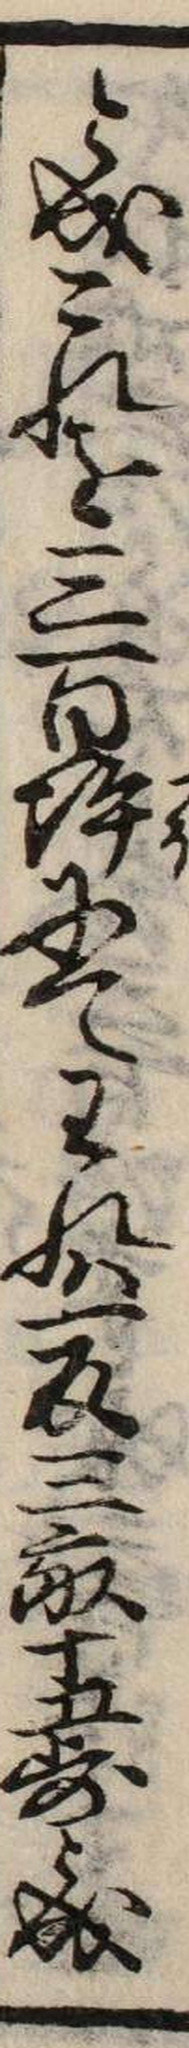と成これを三百坪にてわれは一反三畝十五歩と成
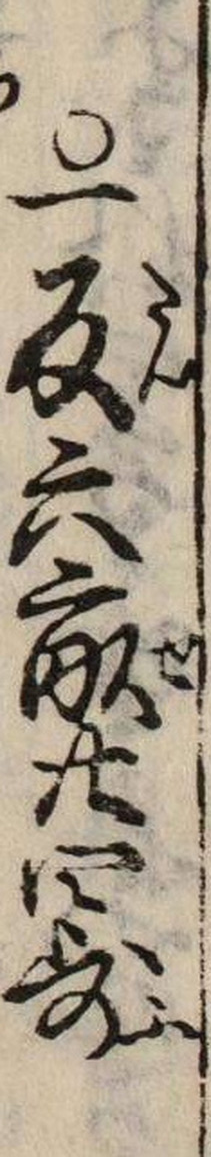○一反六畝廿四歩
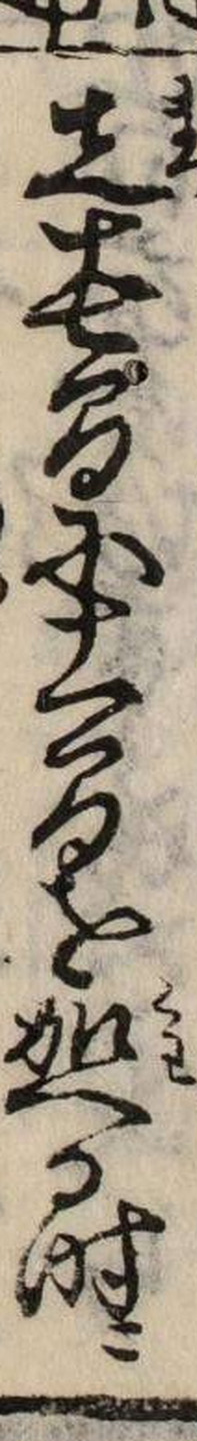先十七間に十一間を加へる時に
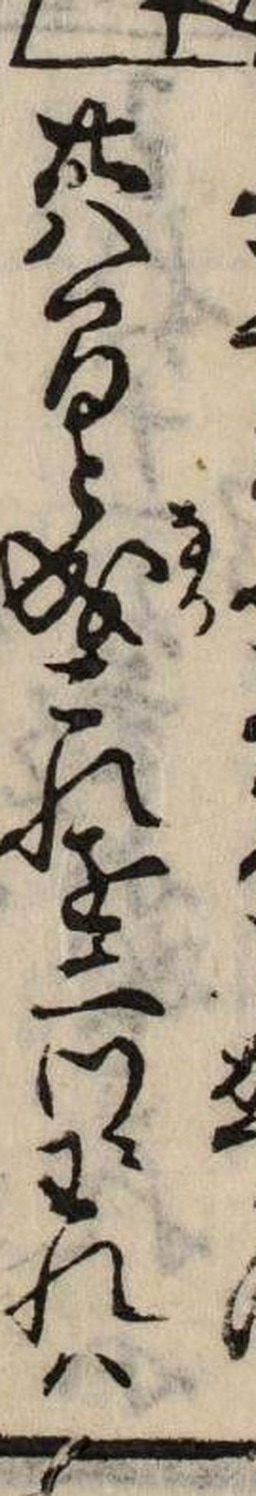廿八間と成これを二つにわれは
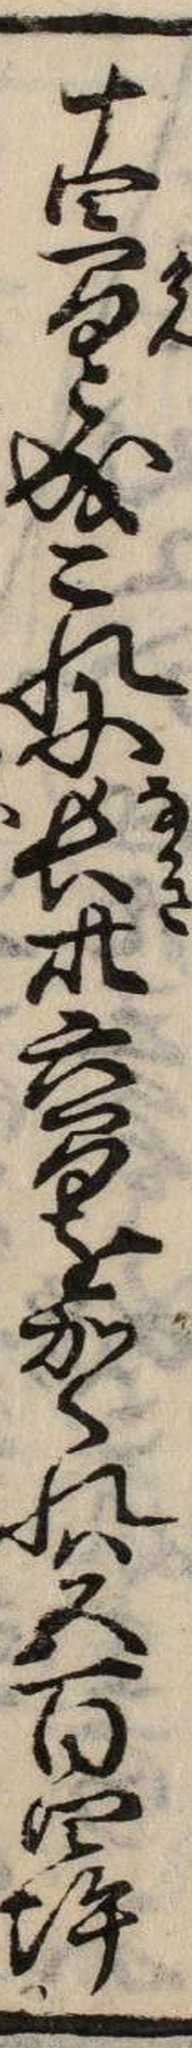十四間と成これに長卅六間をかくれは五百四坪
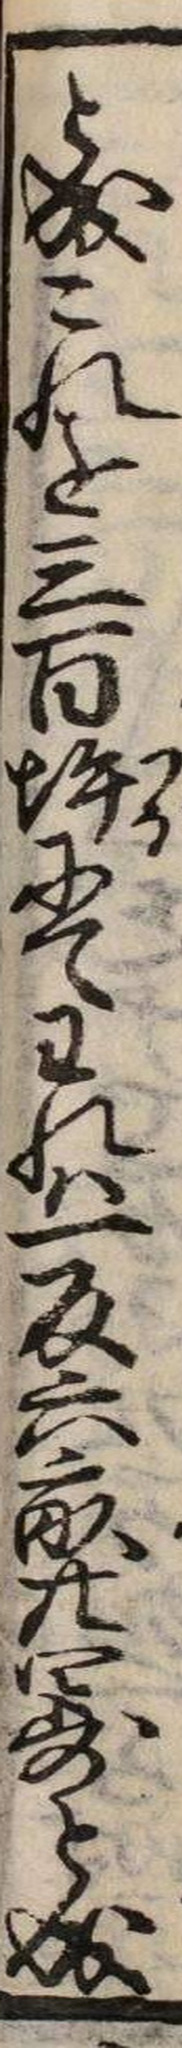と成これを三百坪にてわれは一反六畝廿四歩と成
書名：塵劫記（寛永11年自跋、京都府立京都学・歴彩館追貴8）
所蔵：京都府立京都学・歴彩館 国文学研究資料館
